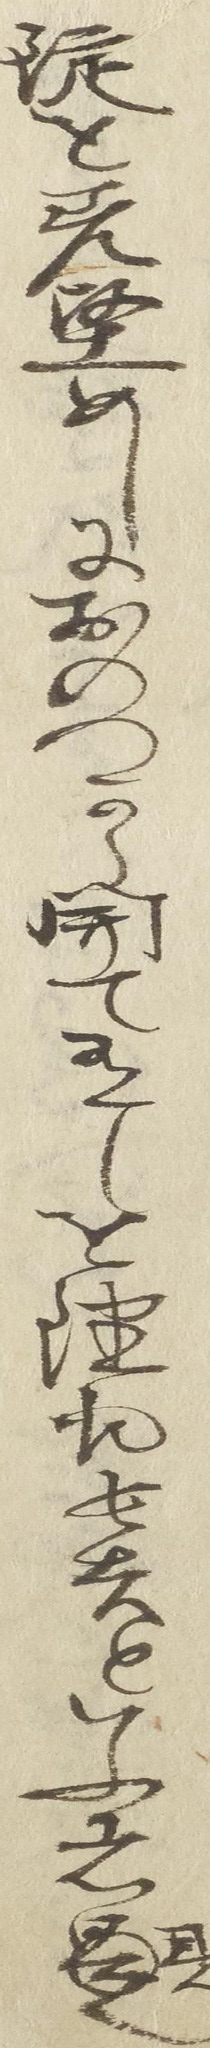錠を差堅めしにおのつから開て有しを鍵取長者といふ者見

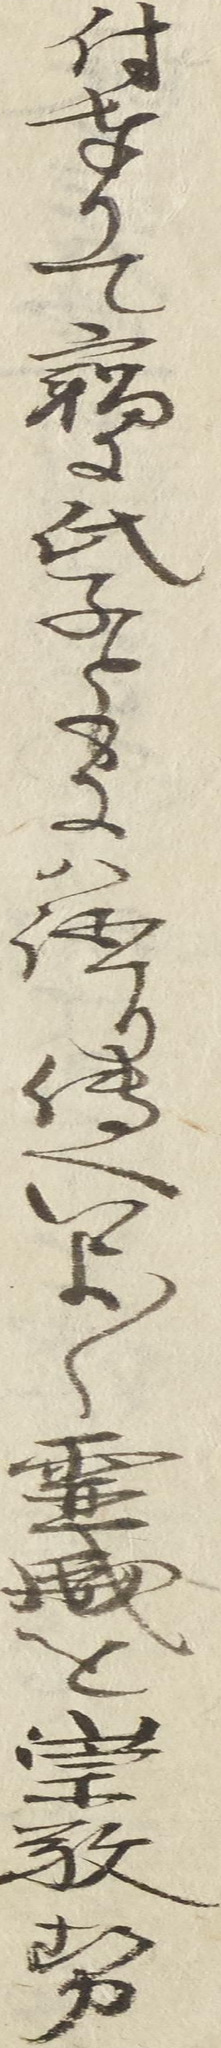付奉りて竊に氏子ともには語り伝へいよ〳〵霊感を崇敬務
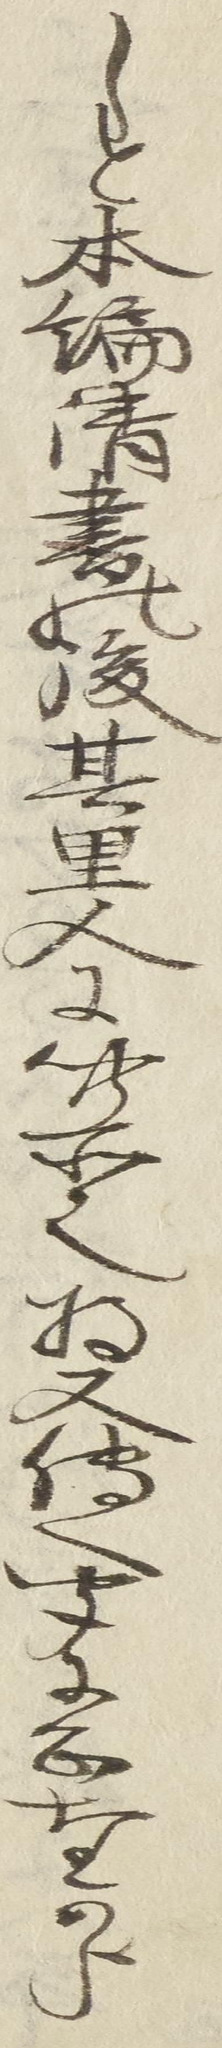しと本編清書の後其里人に聞所也又伝聞に恐なから
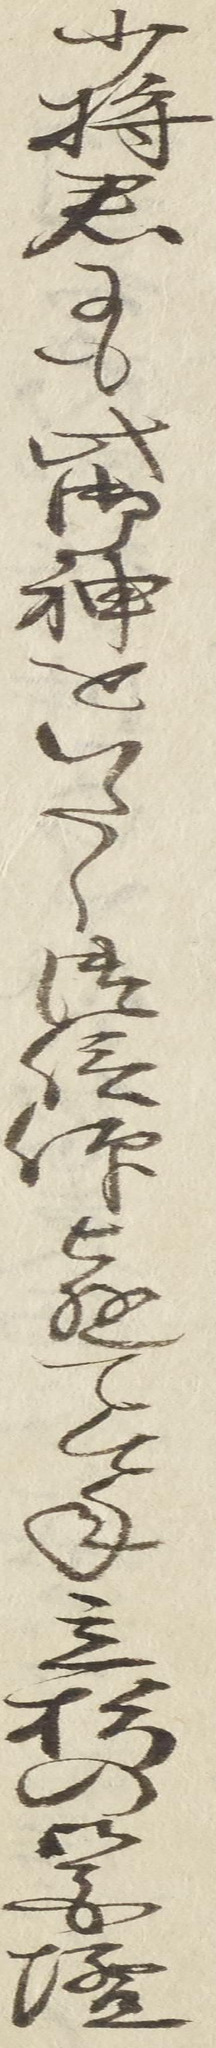少将君にも此御神をいたく御信仰被遊て今年立杉の御白檀
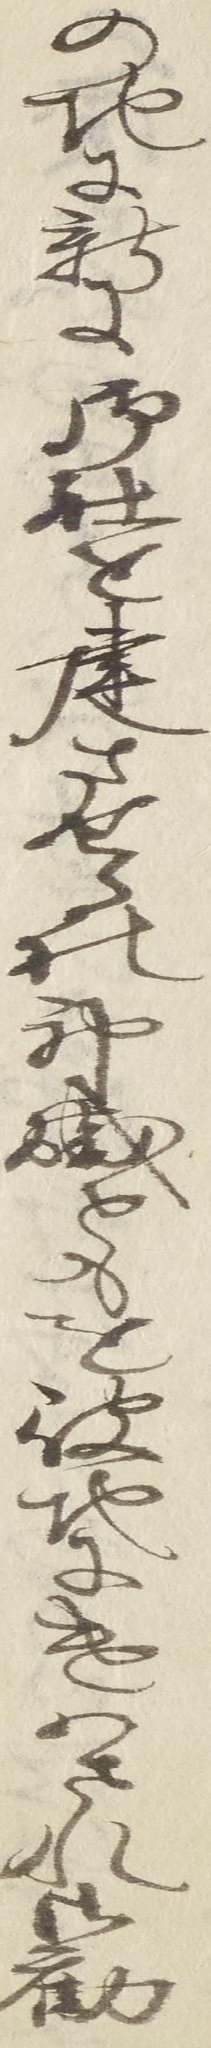の地に新に御社を建させられ神職ともを彼地に遣はされ御勧
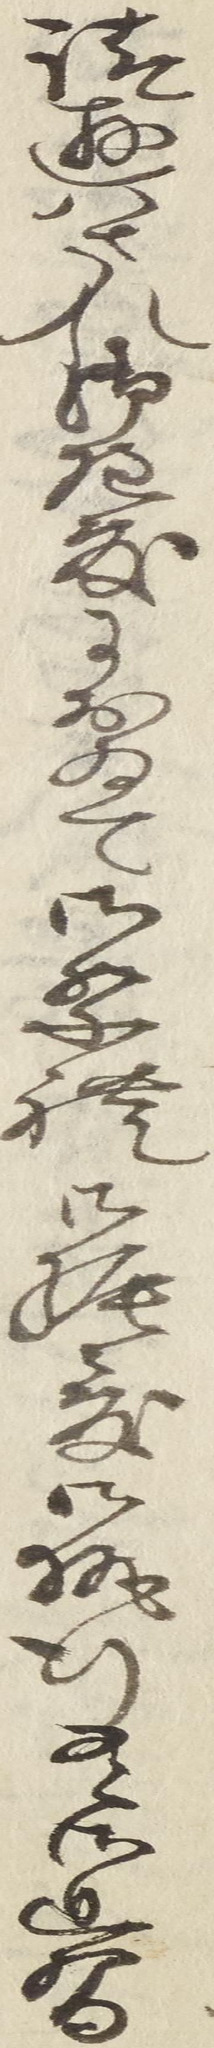請遊はされ御屋敷におゐて御祭礼御賑々敷御執行有御近習
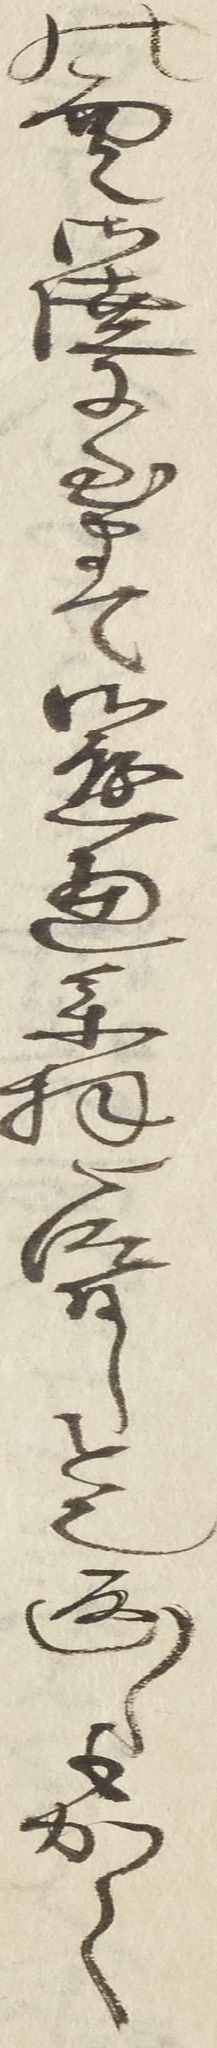の面々御陸に至まて御応通参拝被仰付しと也返〳〵もかく
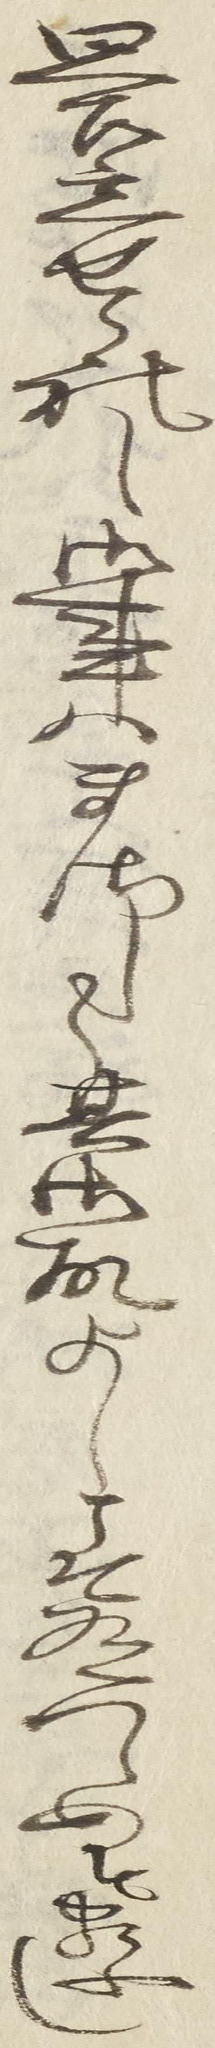思召立せられし御事はまつしく其御故よしく有かたく察し
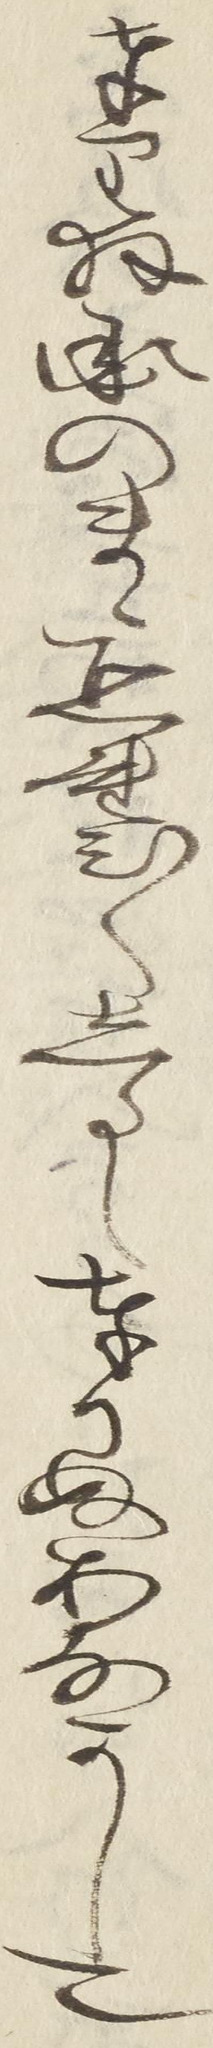奉り拝承のまゝ恐れひくしるし奉りめあなかしこ

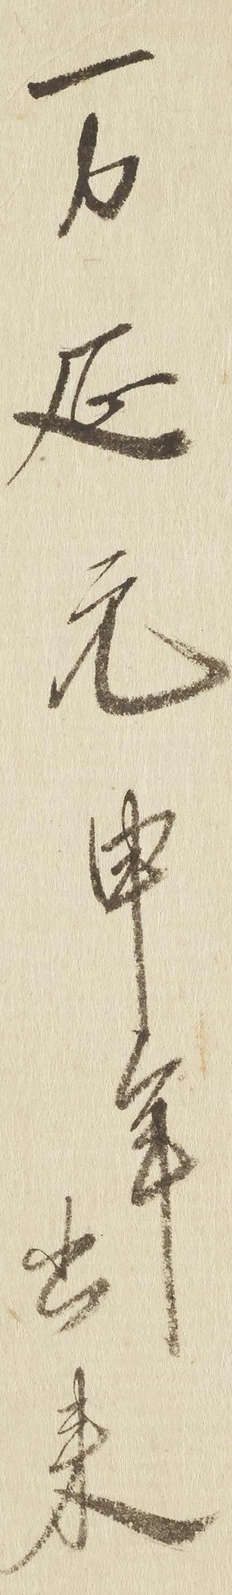万延元年申年出来
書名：地震記　下
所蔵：東京大学地震研究所図書室 Earthquake Research Institute Library, The University of Tokyo, JAPAN
